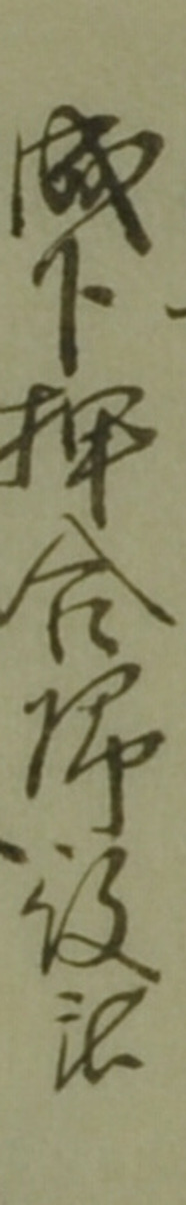成下押合帰役被
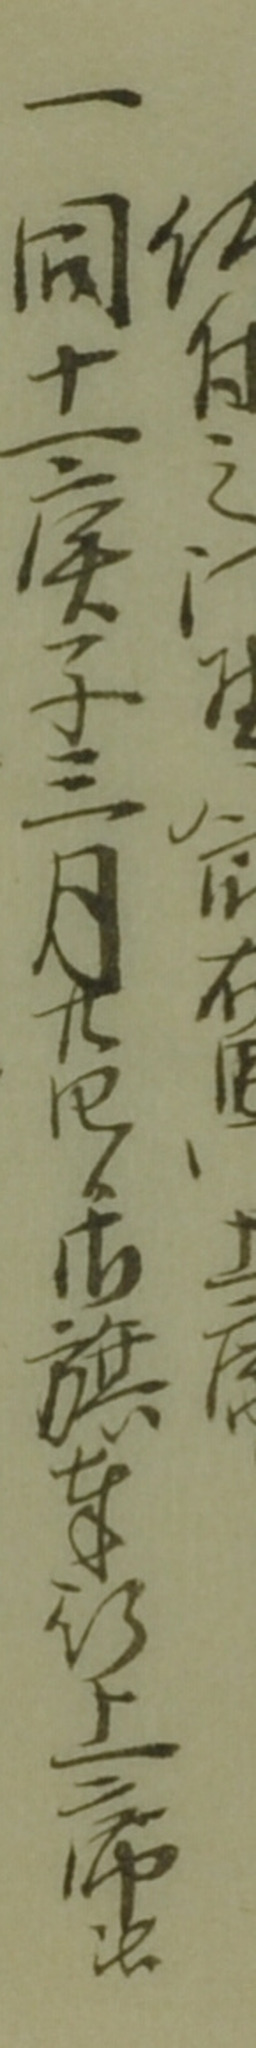一同十一庚子三月廿四日御旗奉行上席被
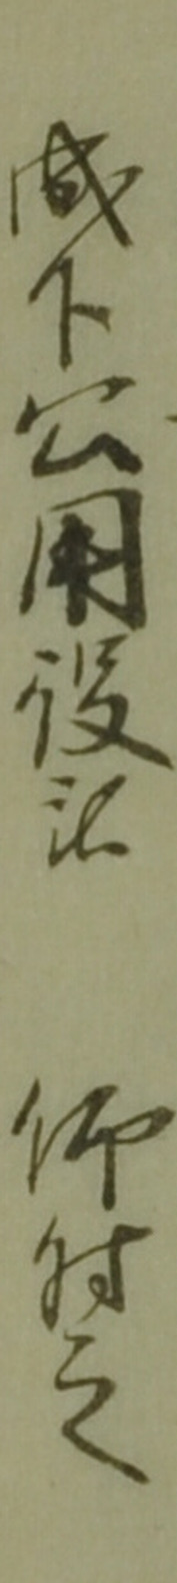成下公用役被仰付之
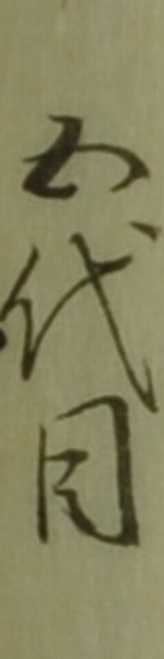五代目
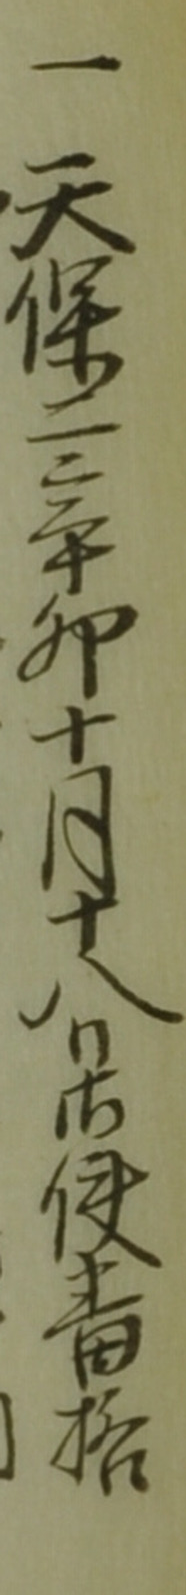一天保二辛卯十月十八日御使番格
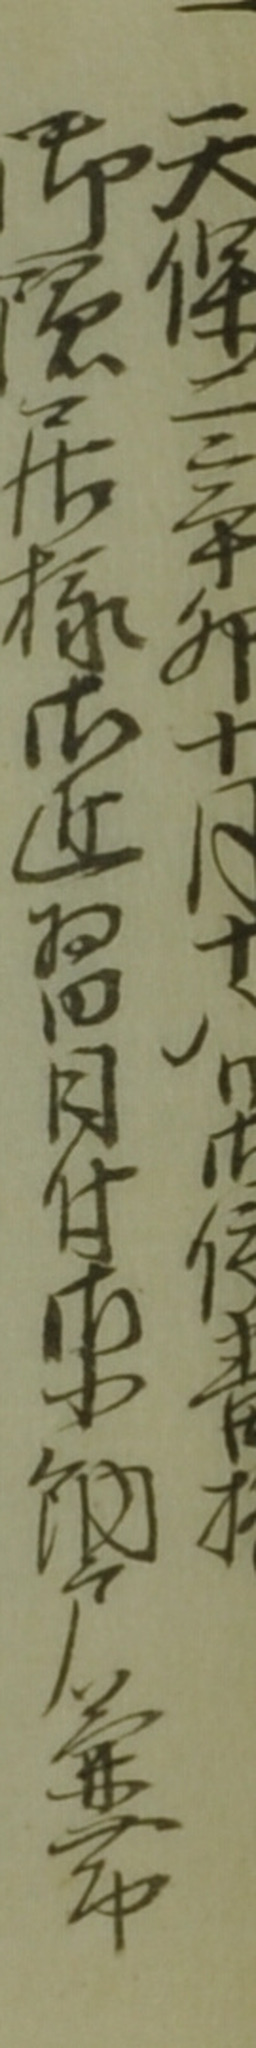御隠居様御近習目付御小納戸兼帯
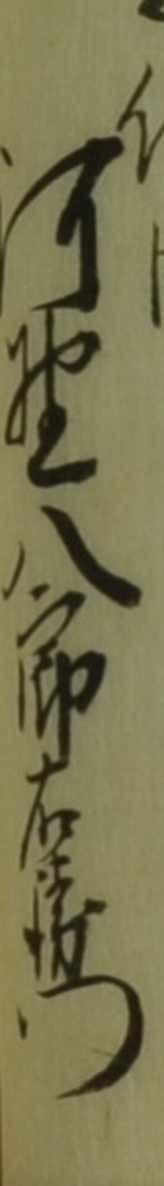河野八郎右衛門
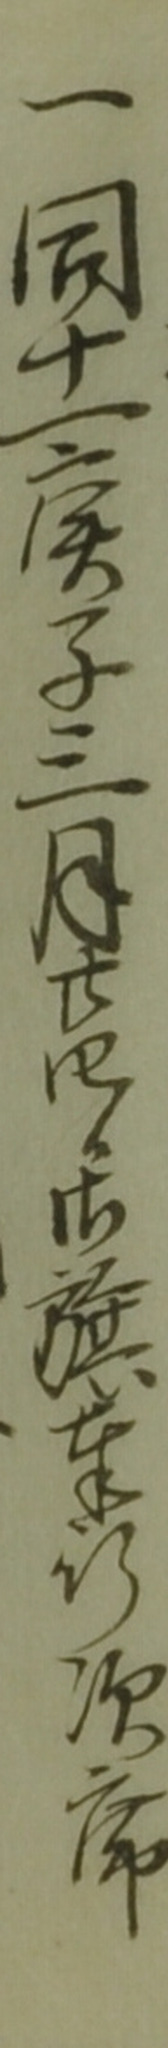一同十一庚子三月廿四日御旗奉行次席
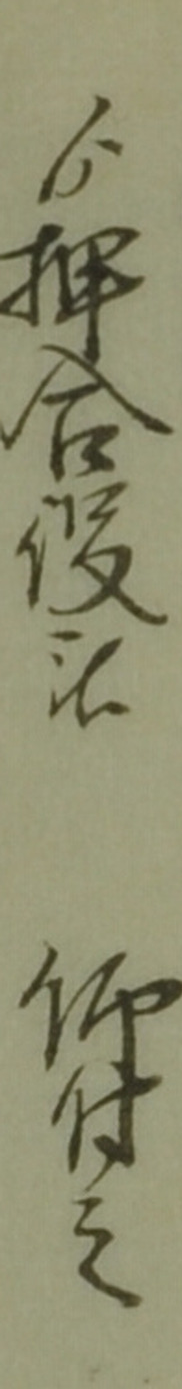ゟ押合役被仰付之
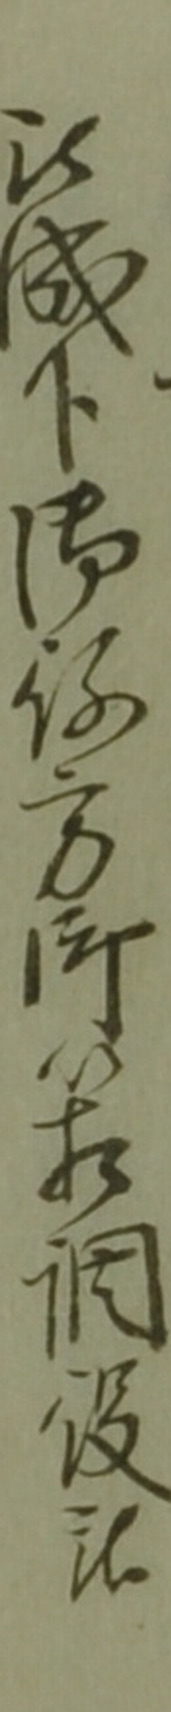被成下御役方御心相調役被
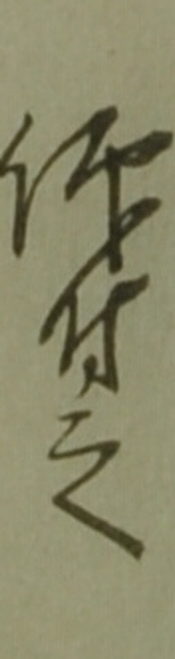仰付之
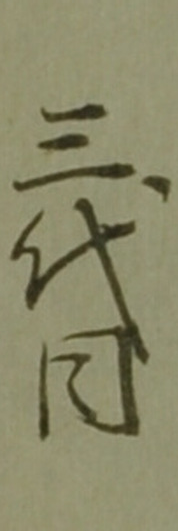三代目
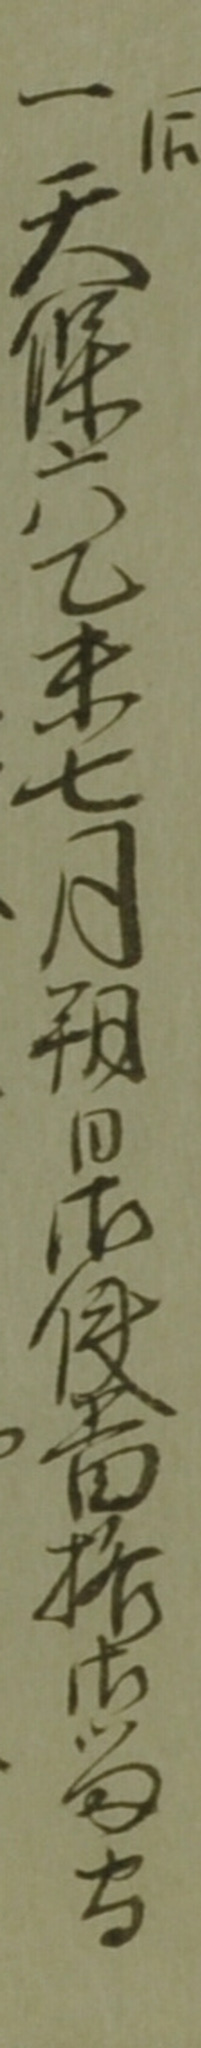一天保六乙未七月朔日御使番格御留守
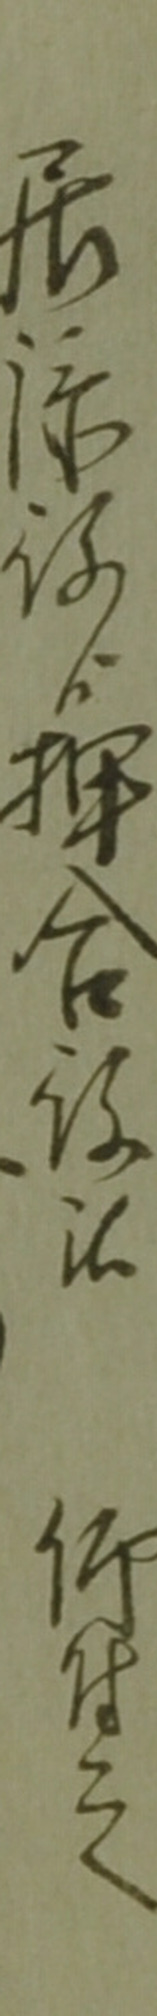居添役ゟ押合役被仰付之
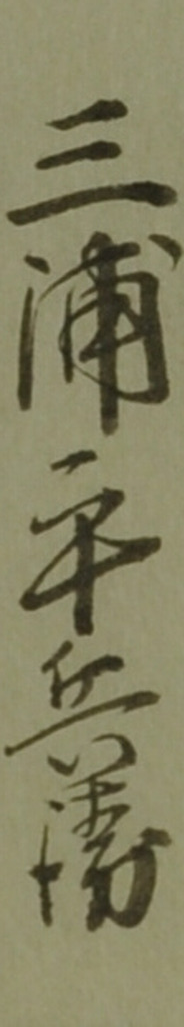三浦平兵衛
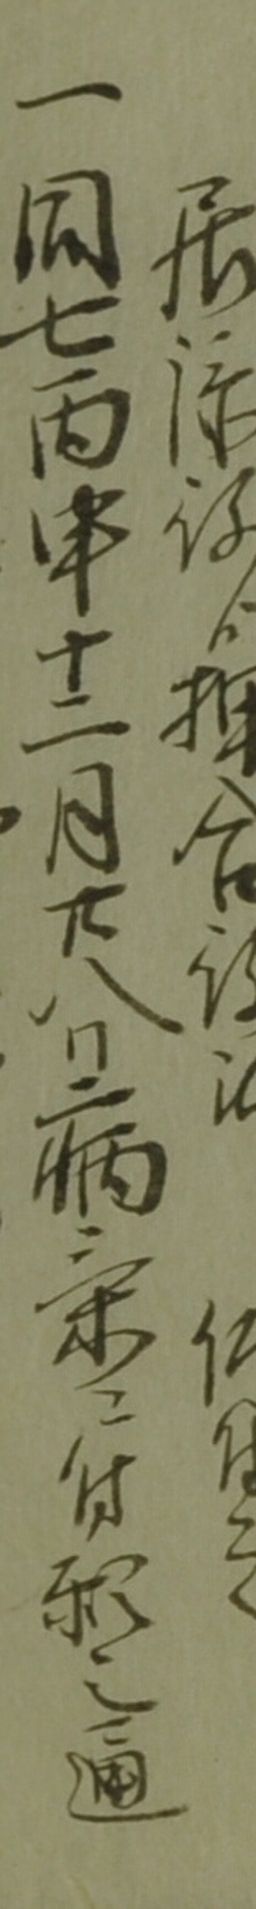一同七丙申十二月廿八日病気ニ付願之通
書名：諸御役代々録（七）
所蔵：伊那市立高遠町図書館・合同会社AMANE
